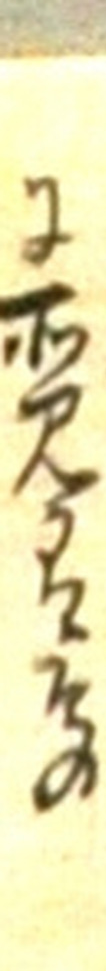に所見有その
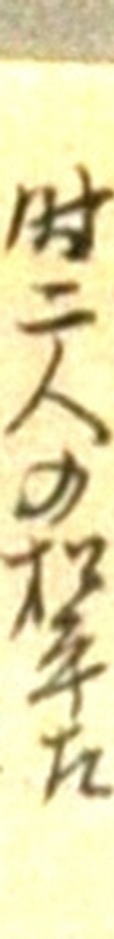時二人の松平左
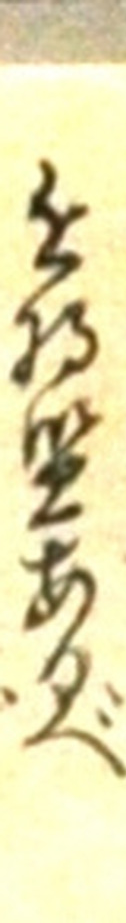近将監あるべ
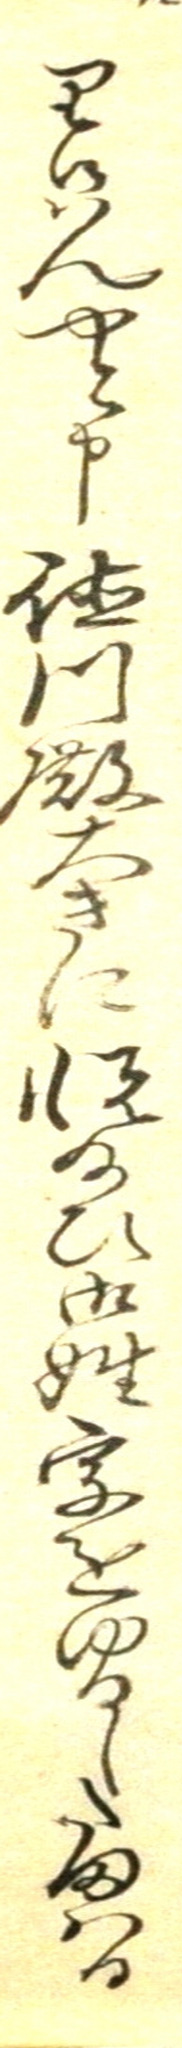り候はんやと申徳川殿大きに悦給ひ御姓字をゆるしたまはる
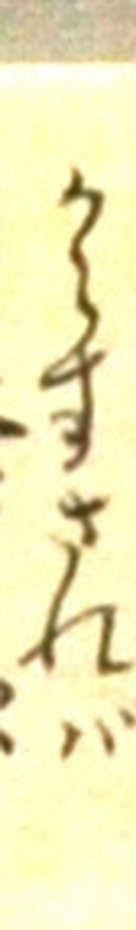からすされば
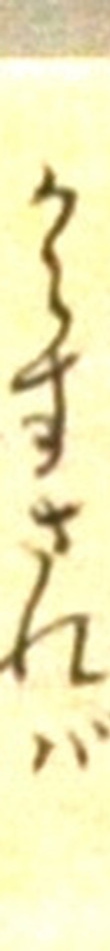からすされば
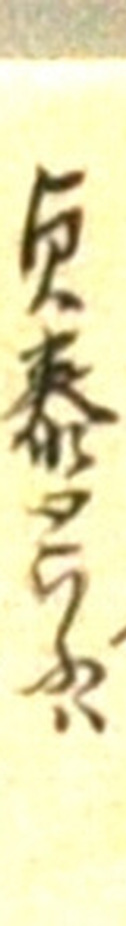貞泰といふは
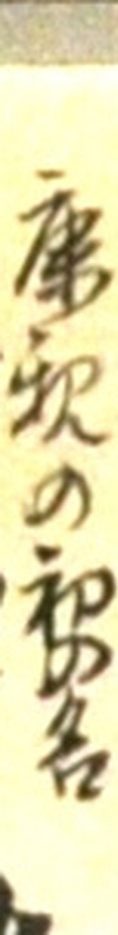康親の初の名
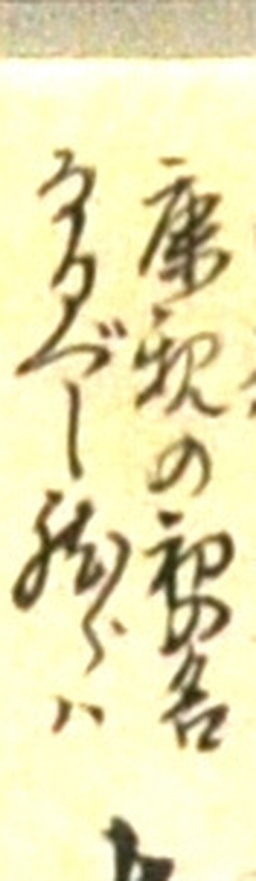なるべし然らは
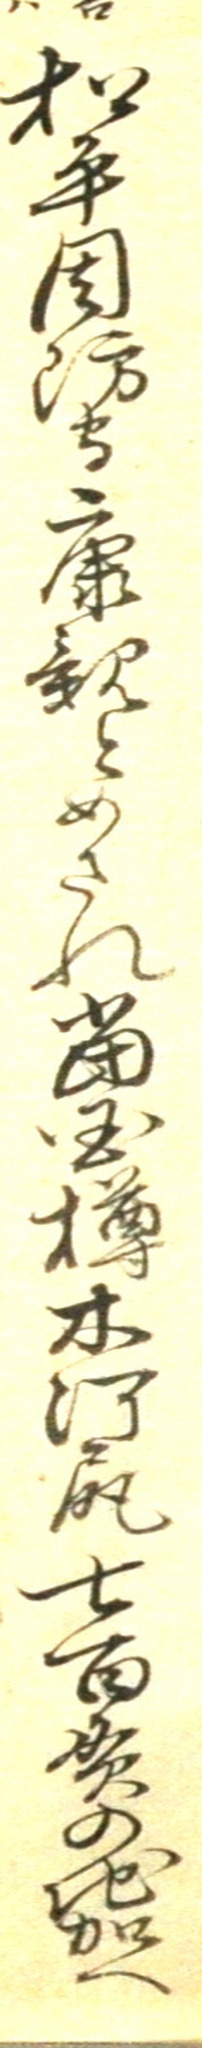松平周防守康親とめされ当国樽木河尻七百貫の地加へ
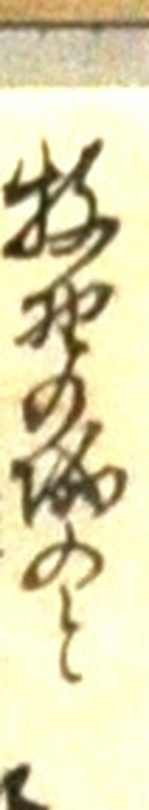牧野の城のと
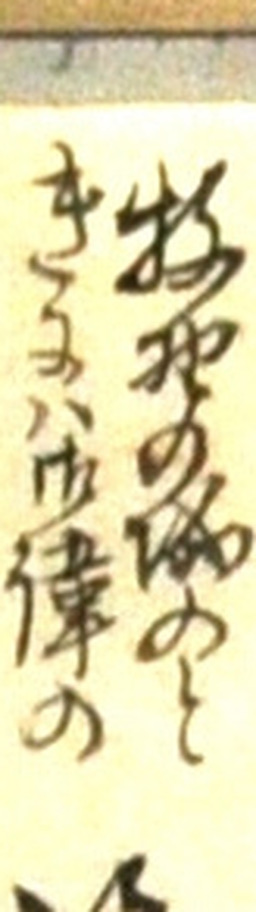きには御諱の
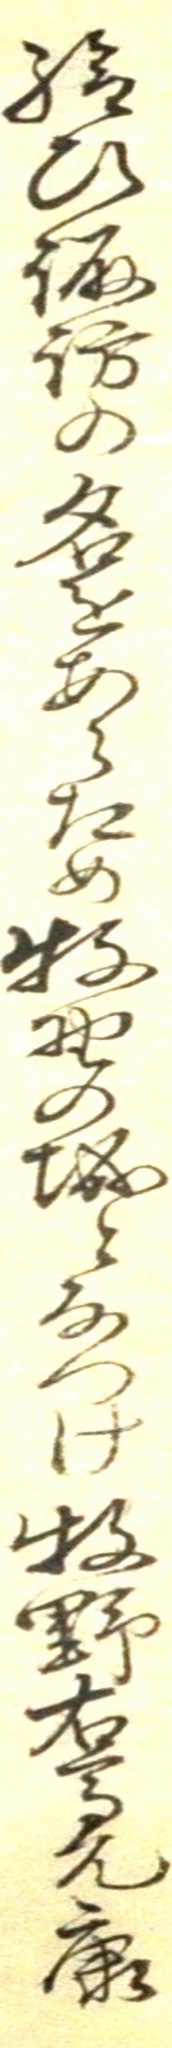給ひ諏訪の名をあらため牧野の城となつけ牧野右馬允康
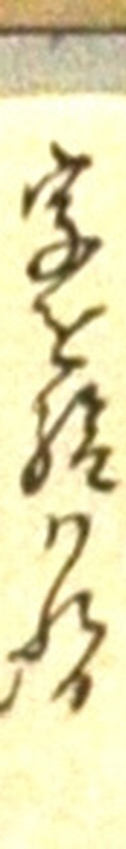字を給われる
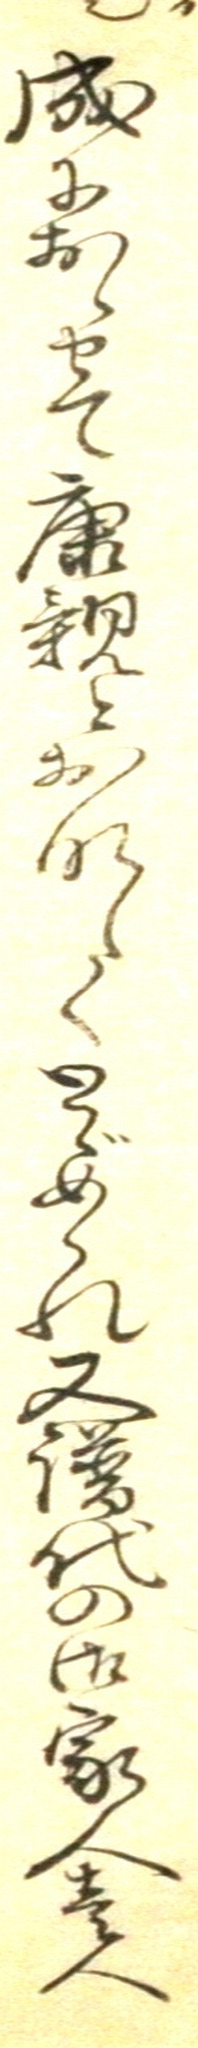成におゝせて康親とおなしくとゞめられ又普代の御家人壱人
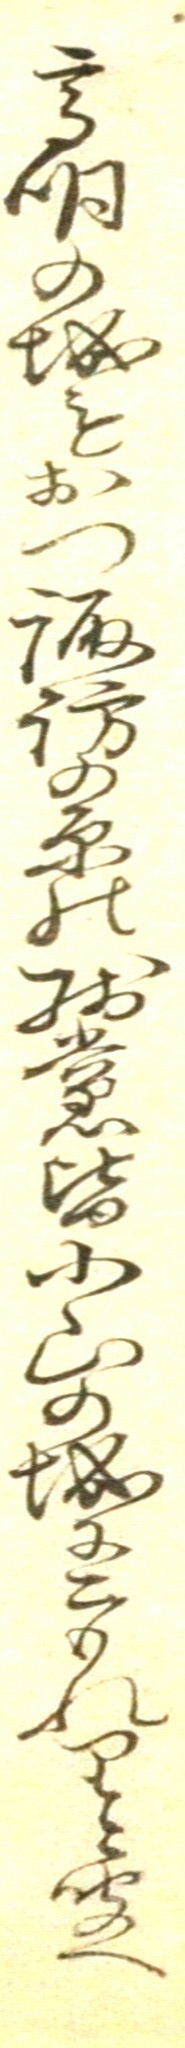高明の城もおつ諏訪の原の残党皆小山の城にこもれりと聞へ
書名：藩翰譜（四・下）
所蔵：伊那市立高遠町図書館・合同会社AMANE
